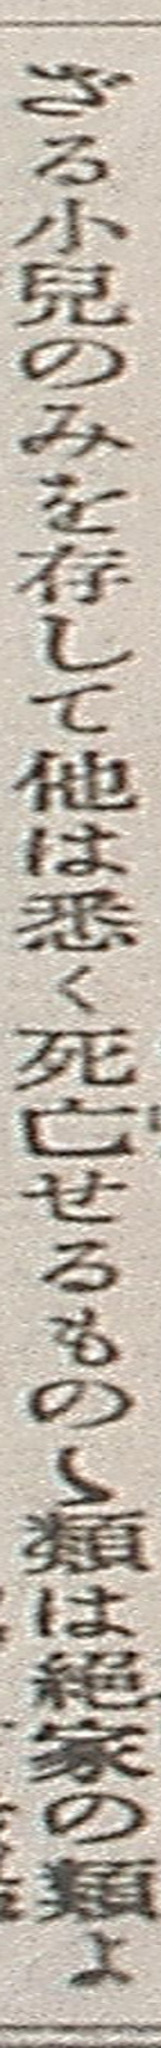ざる小児のみを存して他は悉く死亡せるものゝ類は絶家の類よ
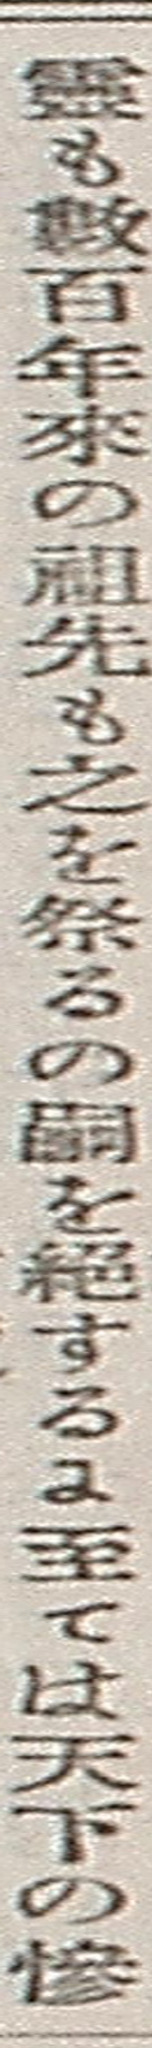霊も数百年来の祖先も之を祭るの嗣を絶するに至ては天下の惨
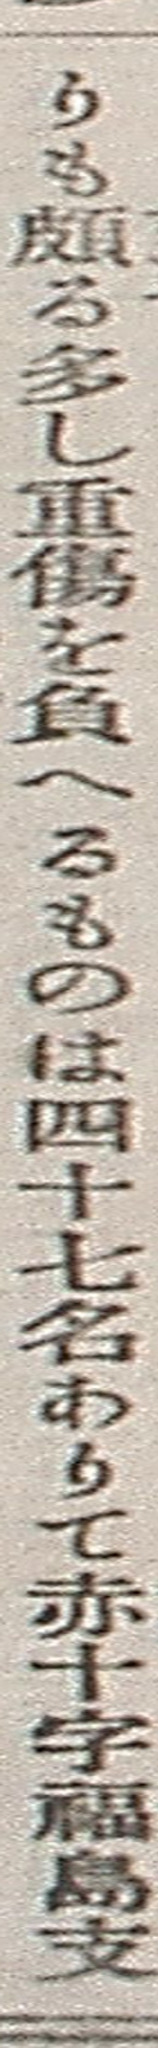りも頗る多し重傷を負へるものは四十七名ありて赤十字福島支
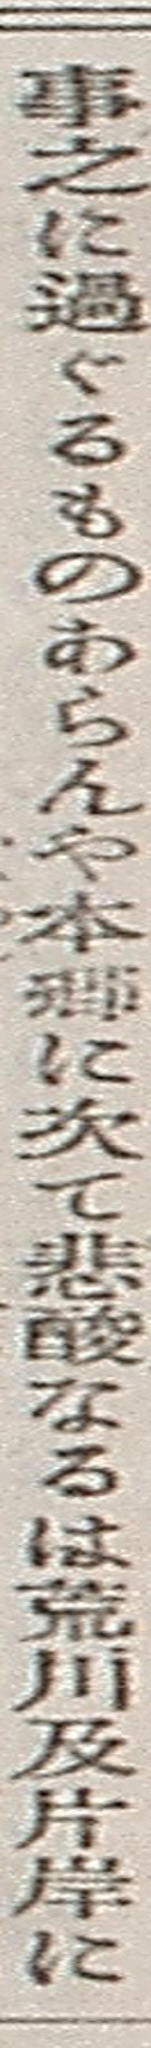事之に過ぐるものあらんや本郷に次て悲酸なるは荒川及び片岸に
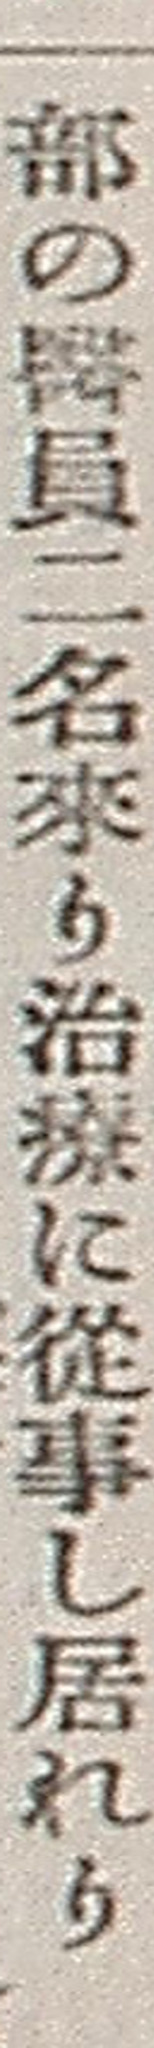部の医員二名来り治療に従事し居れり
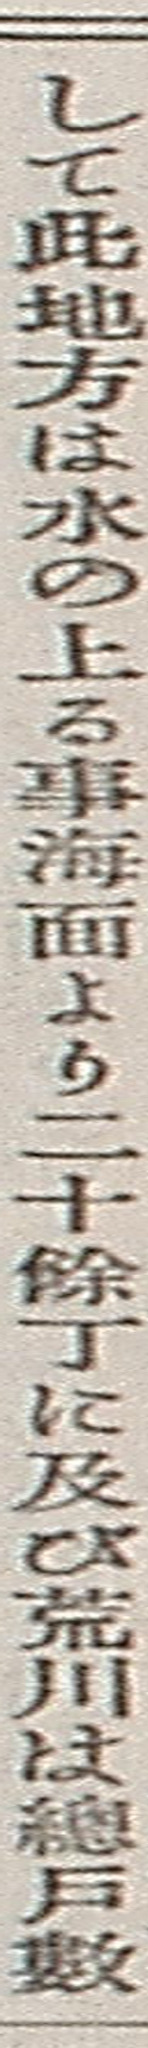して此地方は水の上る事海面より二十余丁に及び荒川は総戸数
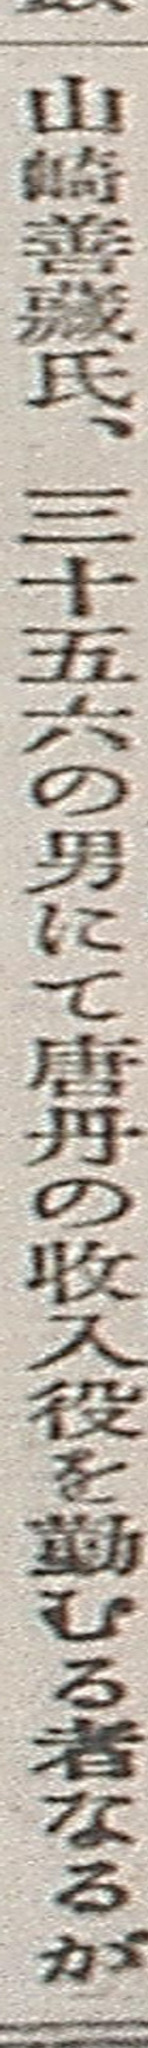山崎善蔵氏、三十五六の男にて唐丹の収入役を勤むる者なるが

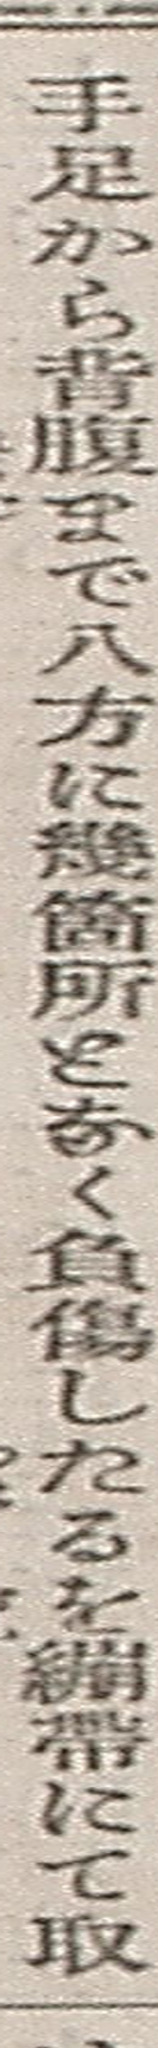手足から背腹まで八方に幾箇所となく負傷したるを繃帯にて取
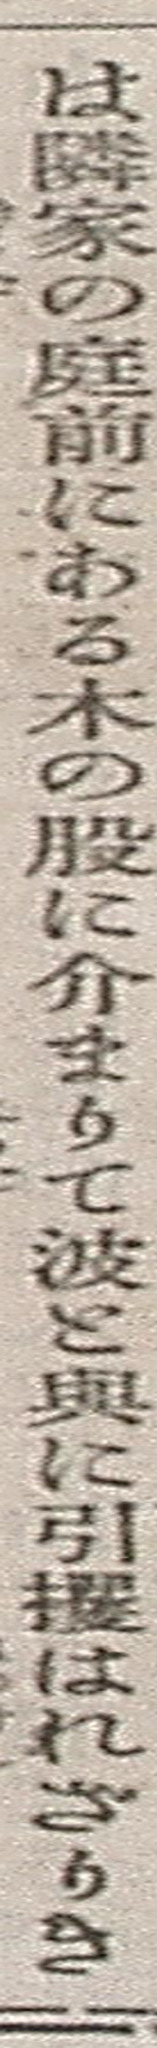は隣家の庭前にある木の股に介まりて波と与に引攫はれざりき
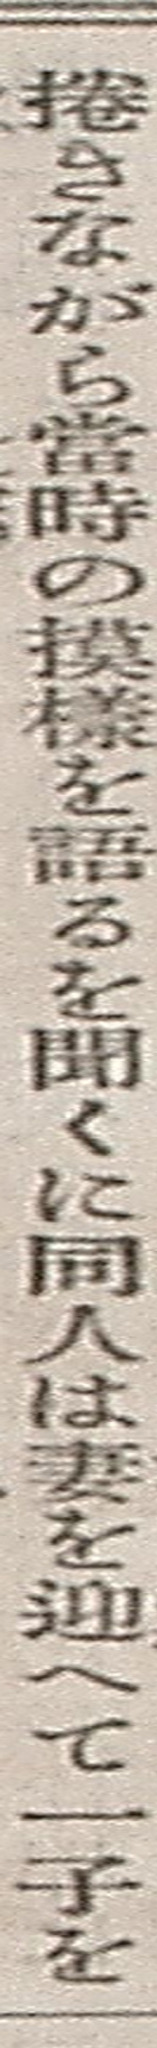捲きながら当時の模様を語るを聞くに同人は妻を迎へて一子を
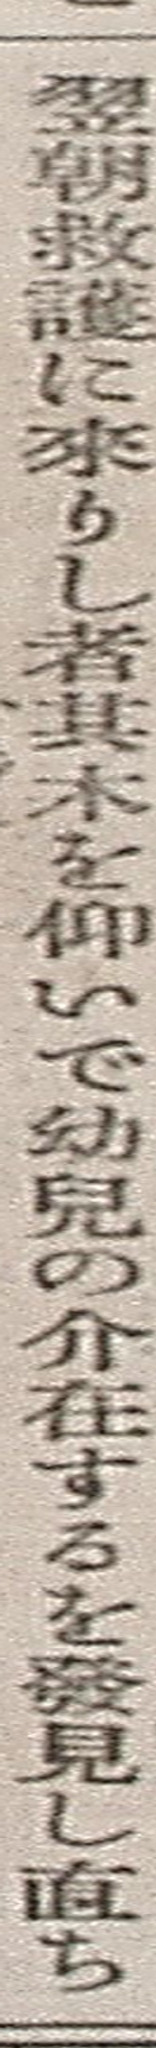翌朝救護に来りし者其木を仰いで幼児の介在するを発見し直ち
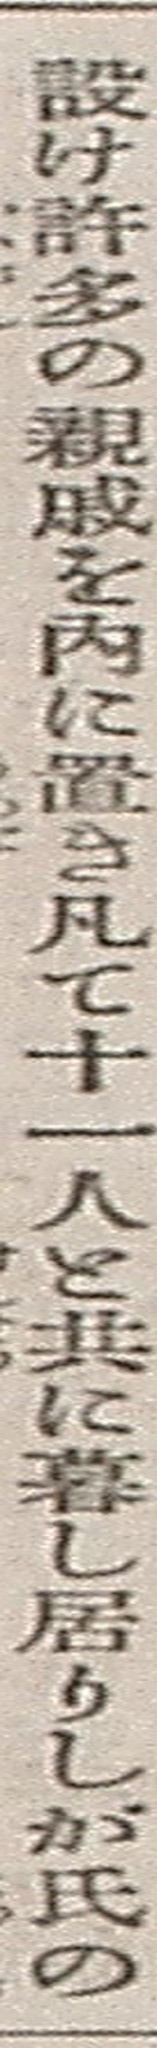設け許多の親戚を内に置き凡て十一人と共に暮し居りしが氏の
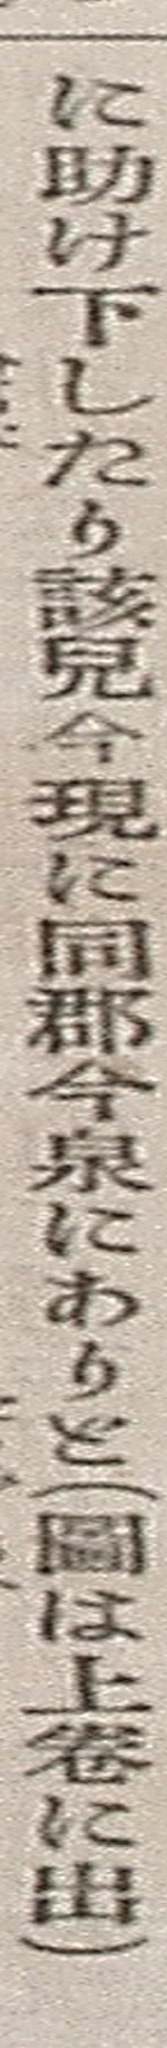に助け下したり該児今現に同郡今泉にありと
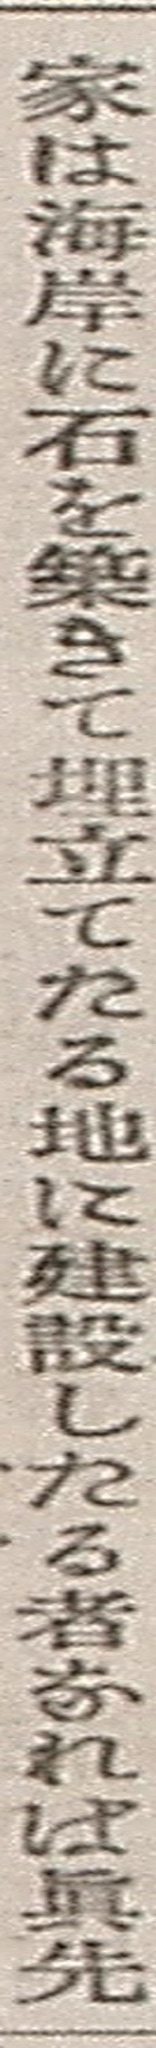家は海岸に石を築きて埋立てたる地に建設したる者なれば真先
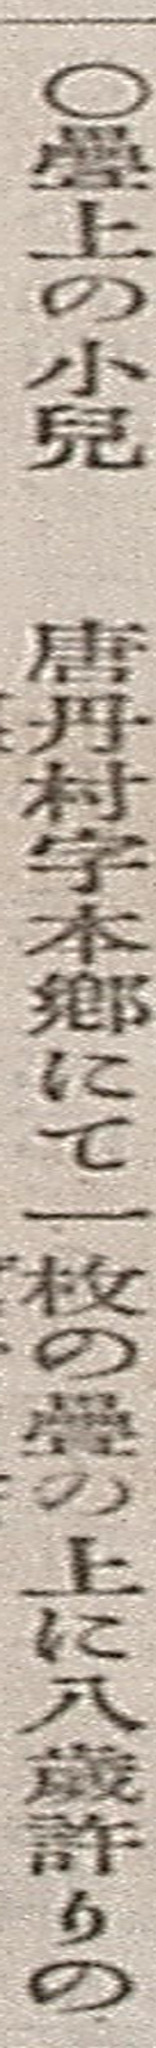○畳上の小児唐丹村字本郷にて一枚の畳の上に八歳許りの
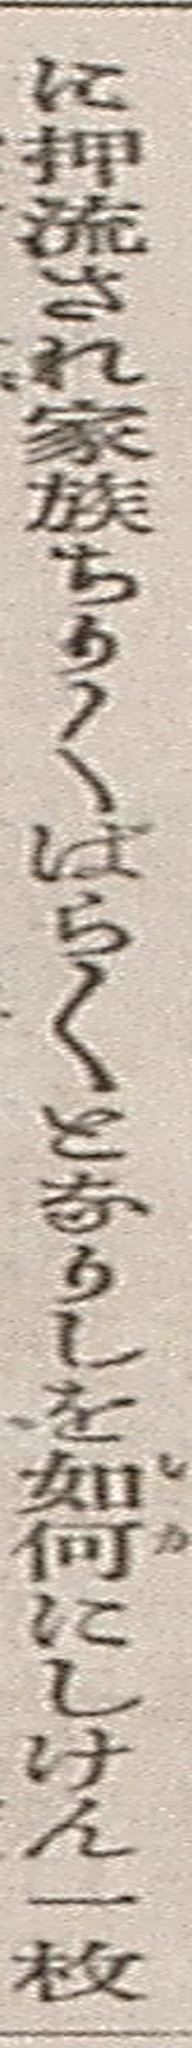に押流され家族ちり〳〵ばら〳〵となりしを如何にしけん一枚
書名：風俗畫報臨時増刊第百十九號　大海嘯被害録（中）
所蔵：東京大学地震研究所図書室 Earthquake Research Institute Library, The University of Tokyo, JAPAN
